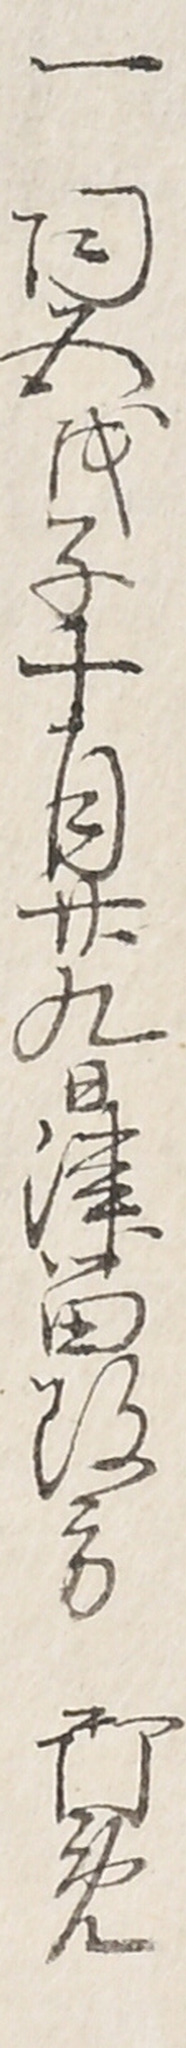一同五戊子十月廿九日津留改方御免
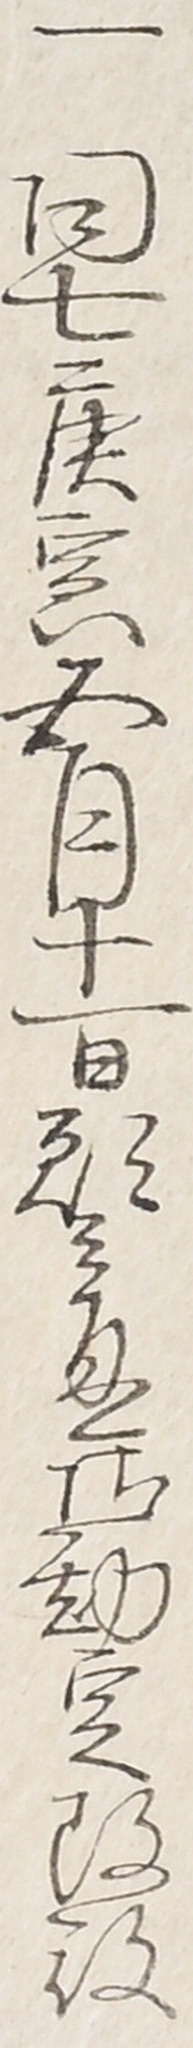一同七庚寅五月十一日願之通御勘定改役
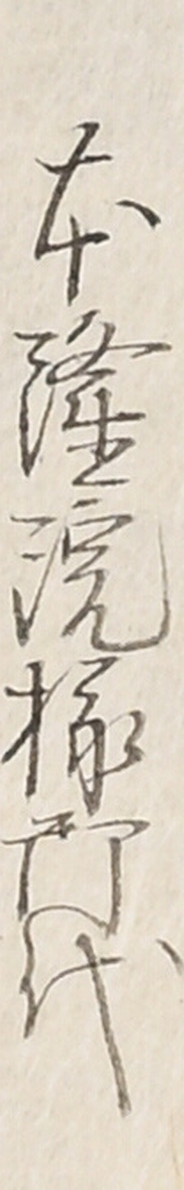本隆院様御代
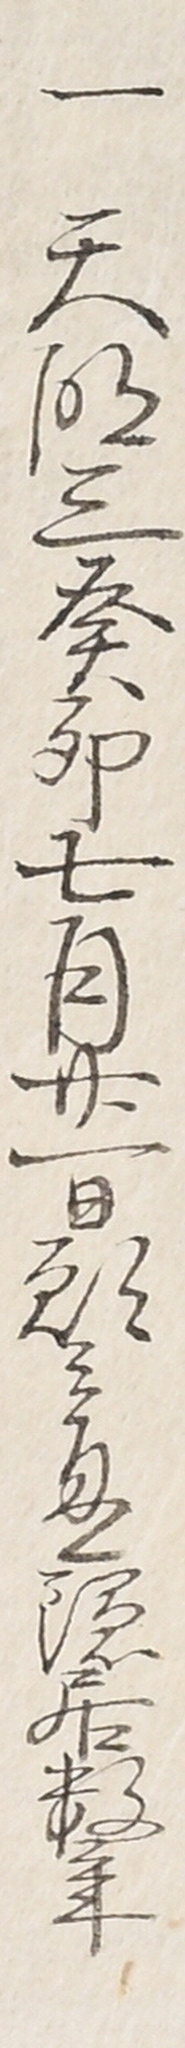一天明三癸卯七月廿一日願之通隠居数年
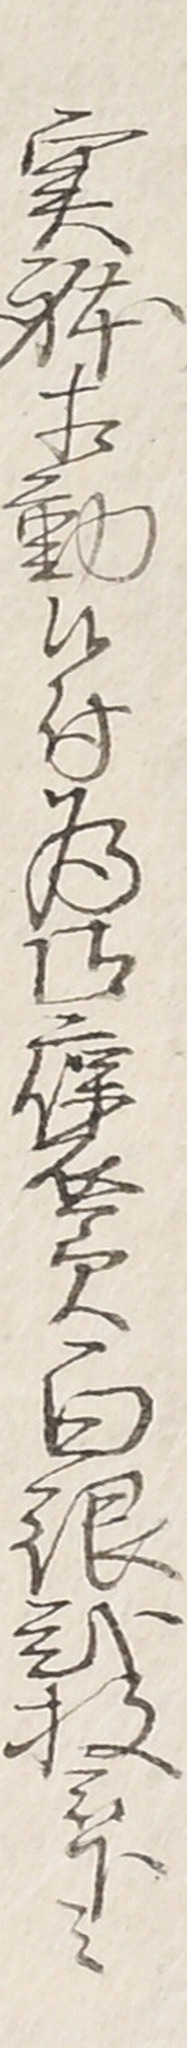実躰相勤候付為御褒美白銀弐枚被下之
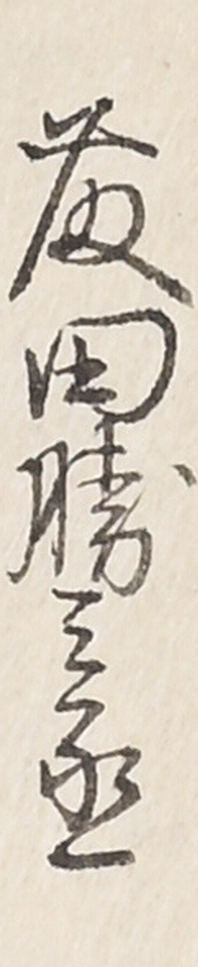藤田勝之丞
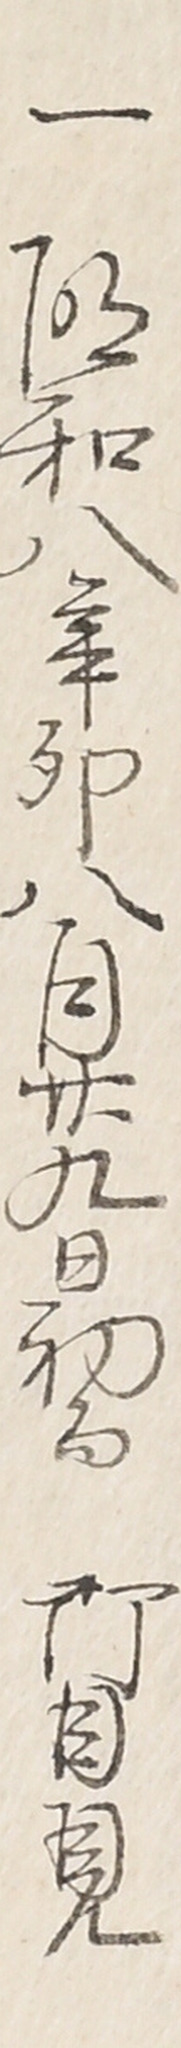一明和八辛卯八月廿九日初而御目見
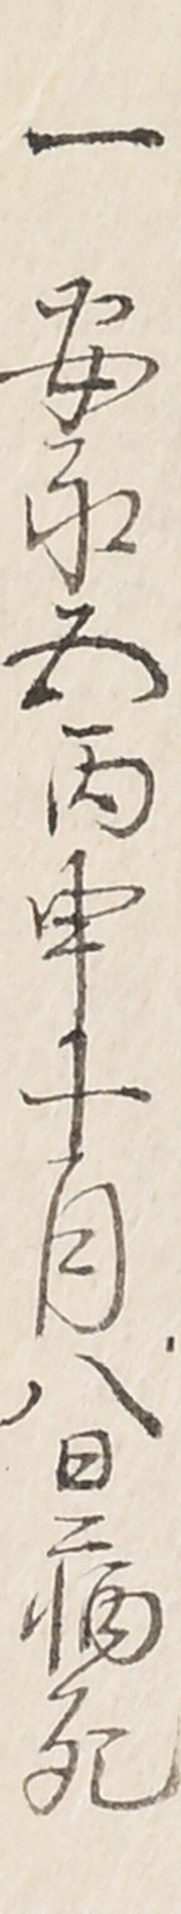一安永五丙申十月八日病死
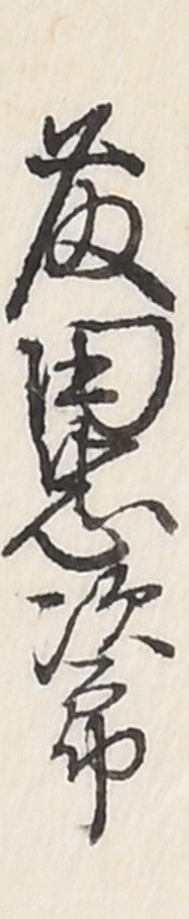藤田忠次郎
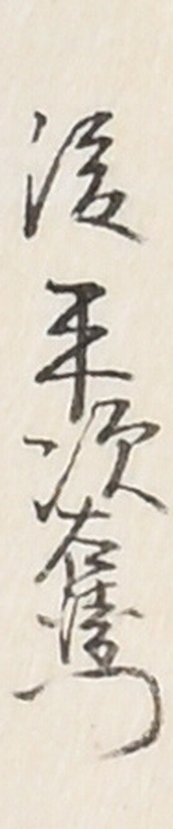後平次右衛門
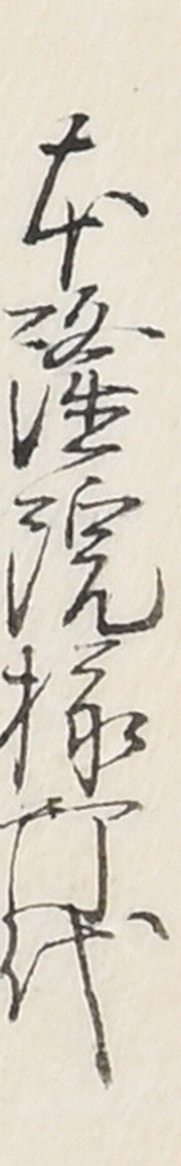本隆院様御代
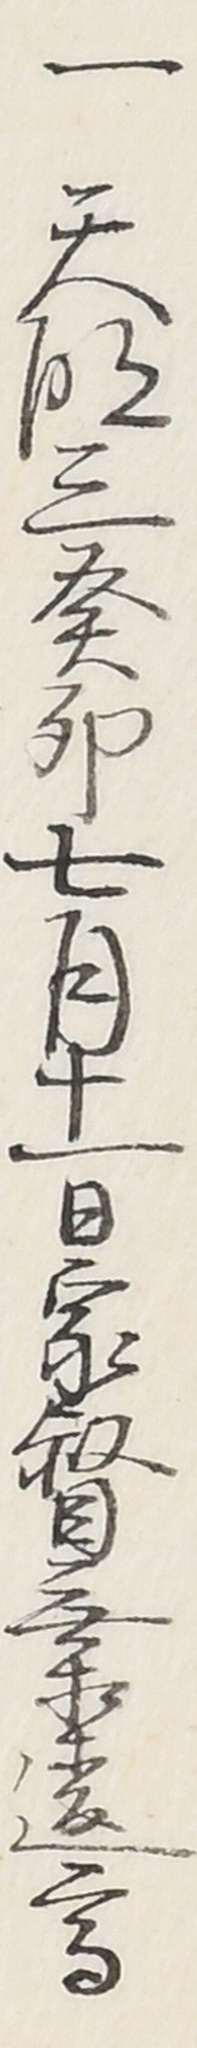一天明三癸卯七月十一日家督無相違高
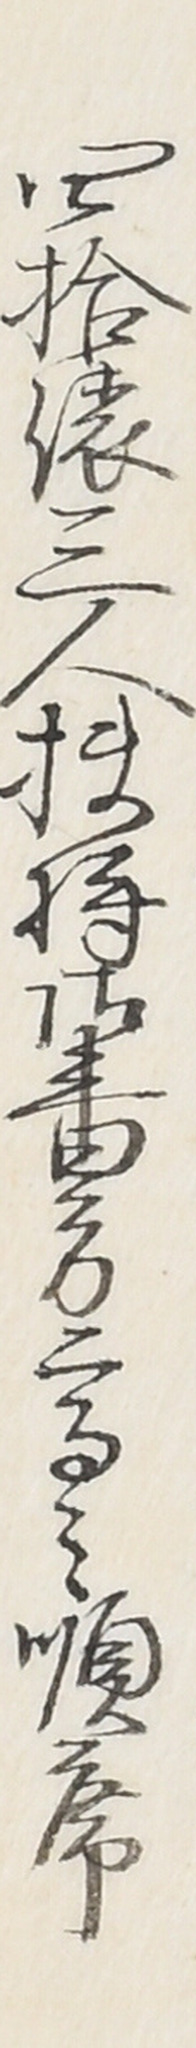四拾俵三人扶持御番方高之順席
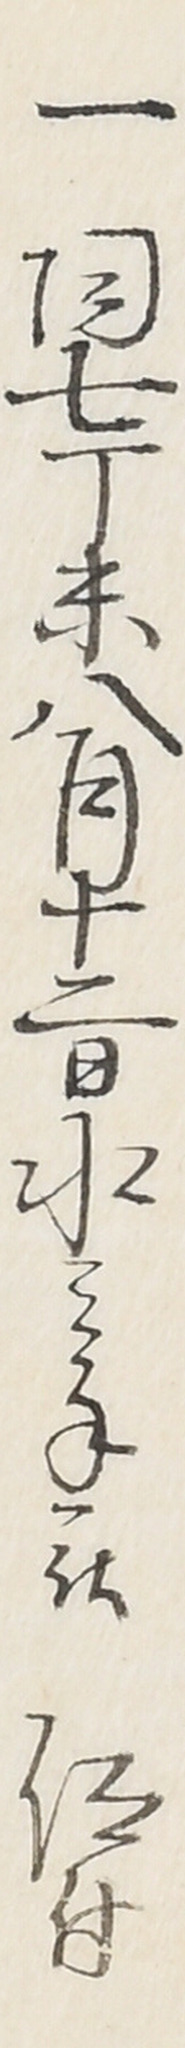一同七丁未八月十二日水之手被仰付
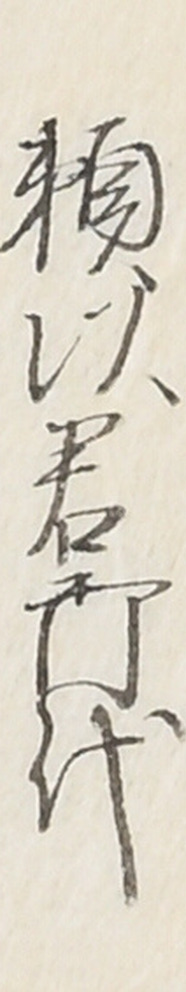頼以君御代
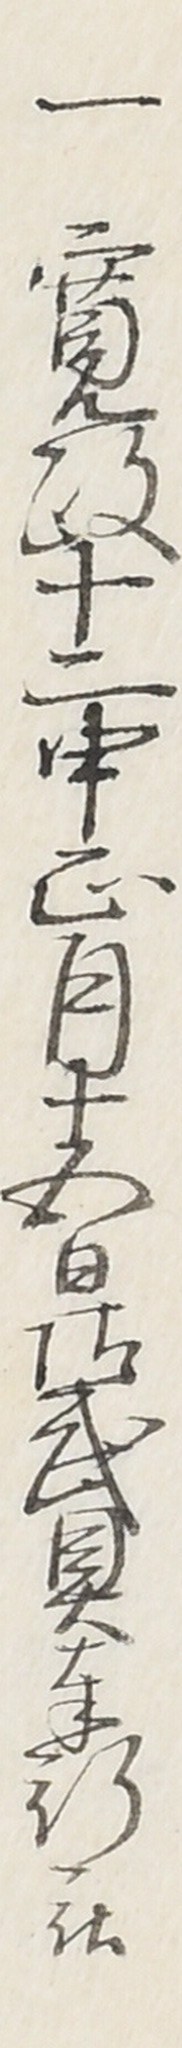一寛政十二申正月十五日御武具奉行被
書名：給人諸士勤仕録（七）
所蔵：伊那市立高遠町図書館・合同会社AMANE
